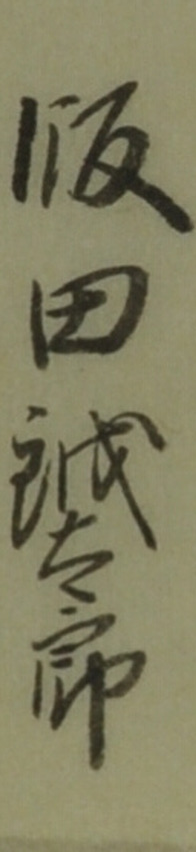飯田誠太郎
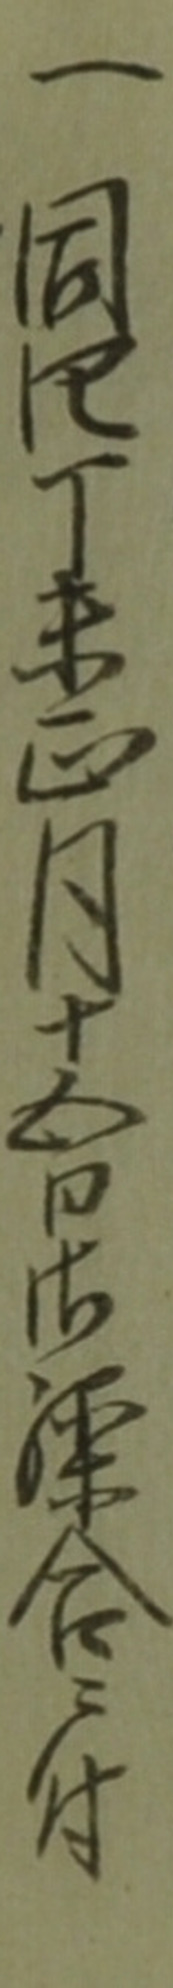一同四丁未正月十五日御繰合ニ付
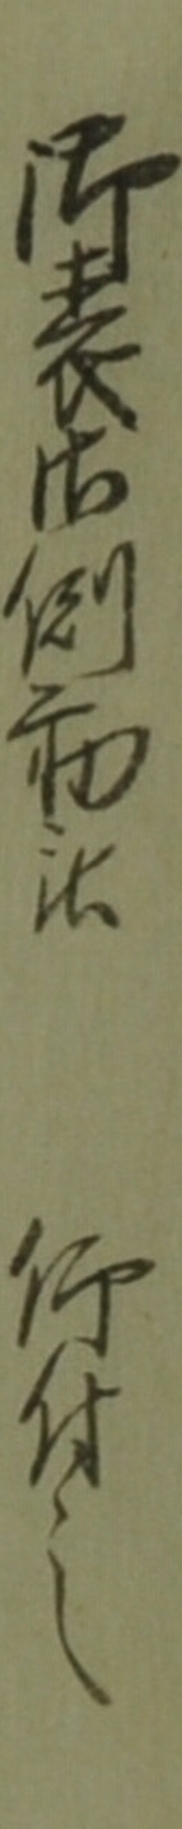御表御側勤被仰付之

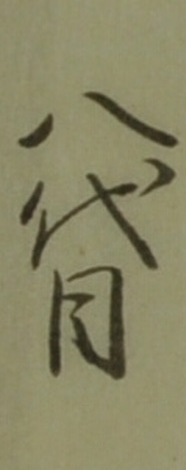八代目
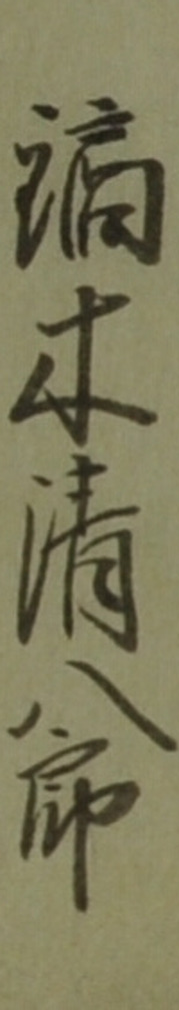鏑木清八郎
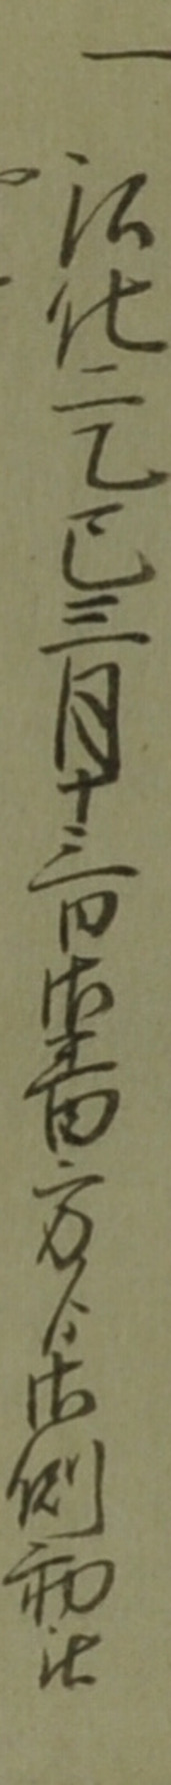一弘化二乙巳三月十三日御番方ゟ御側勤被
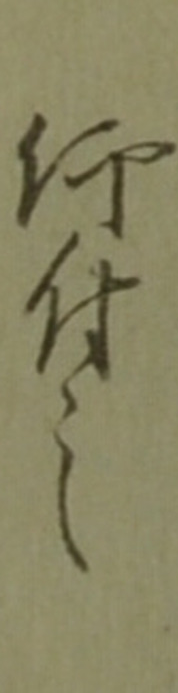仰付之
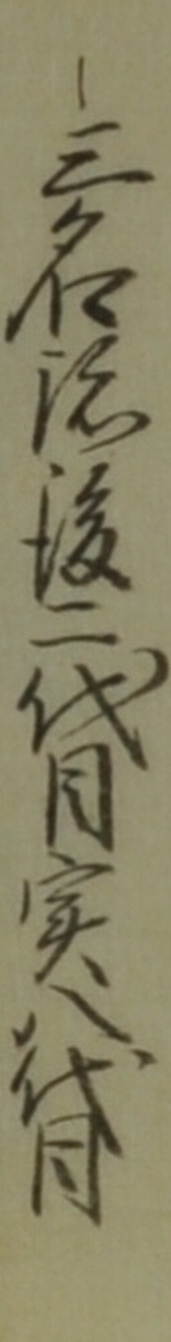三名跡後二代目実は八代目
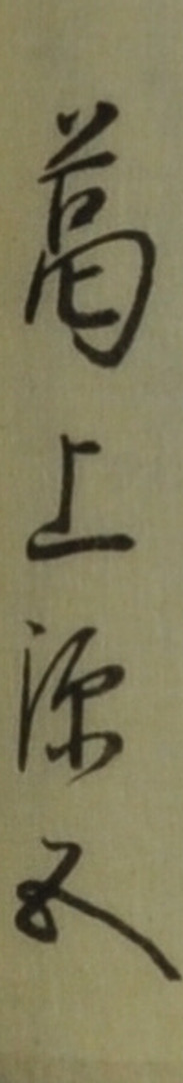葛上源五
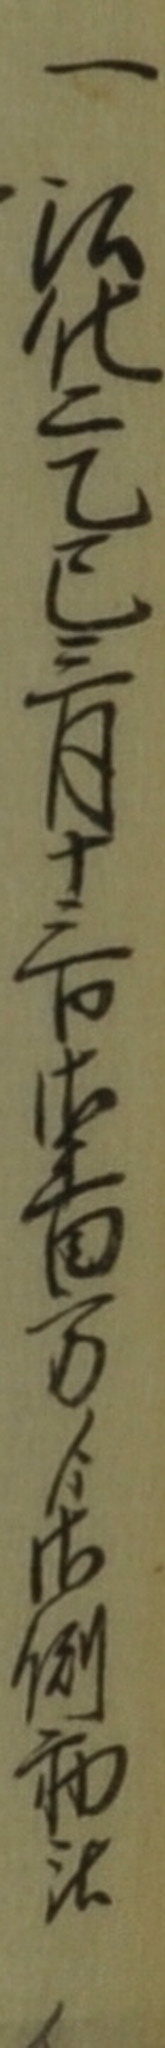一弘化二乙巳三月十三日御番方ゟ御側勤被
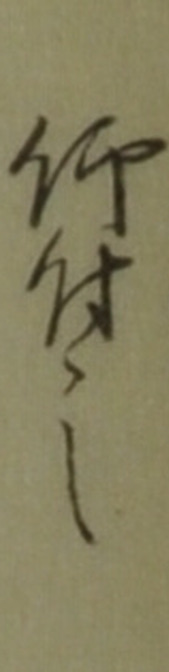仰付之
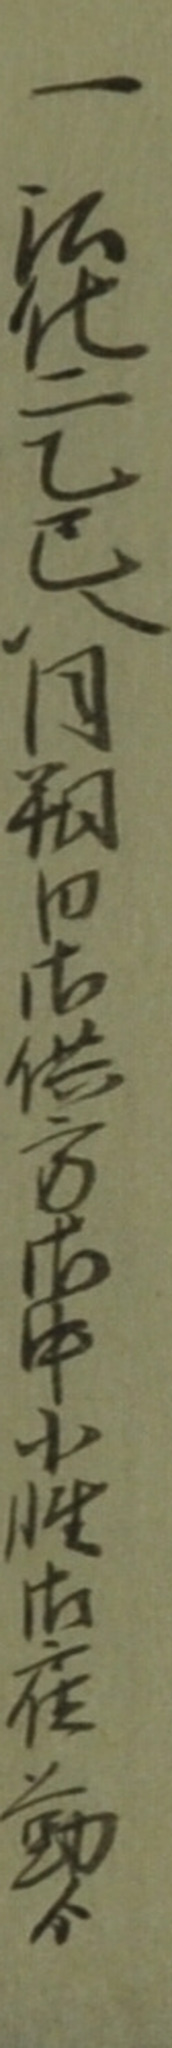一弘化二乙巳八月朔日御供方御中小性御雇勤
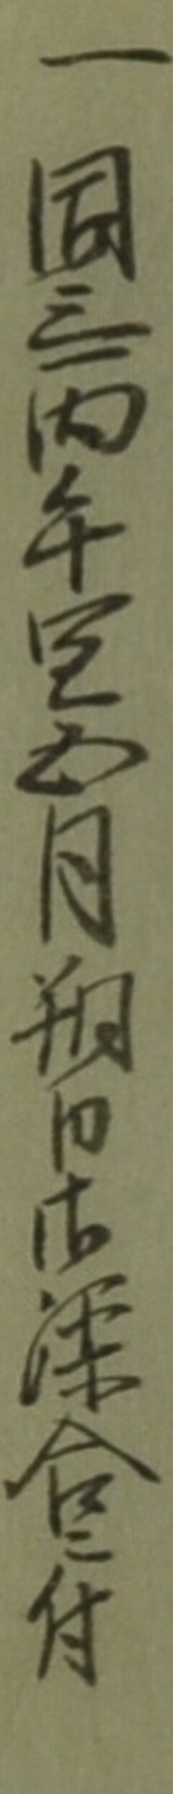一同三丙午閏五月朔日御繰合ニ付
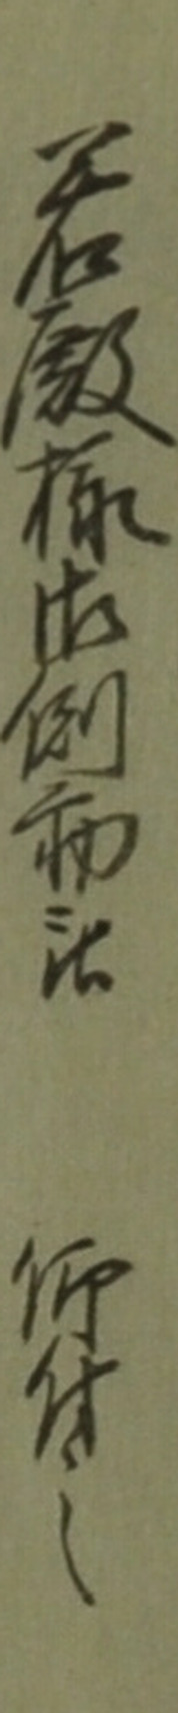若殿様御側勤被仰付之
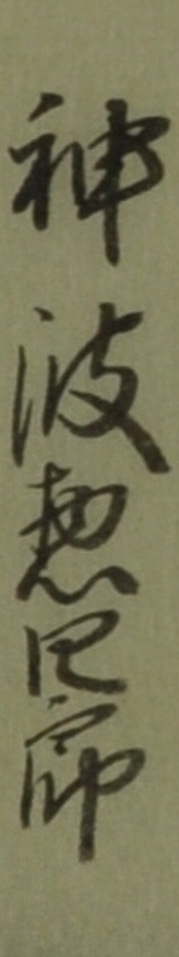神波惣四郎
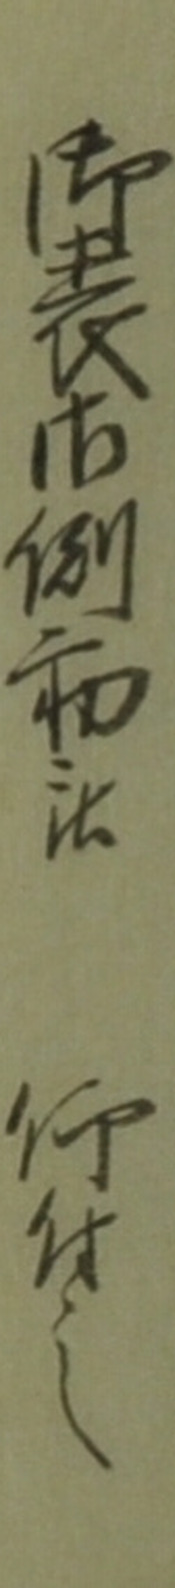御表御側勤被仰付之
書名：諸御役代々録（五）
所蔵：伊那市立高遠町図書館・合同会社AMANE
